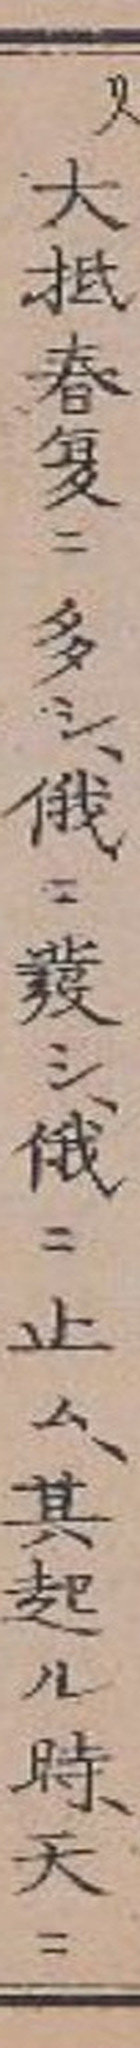リ、大抵春夏ニ多シ、俄ニ発シ、俄ニ止ム、其起ル時、天ニ
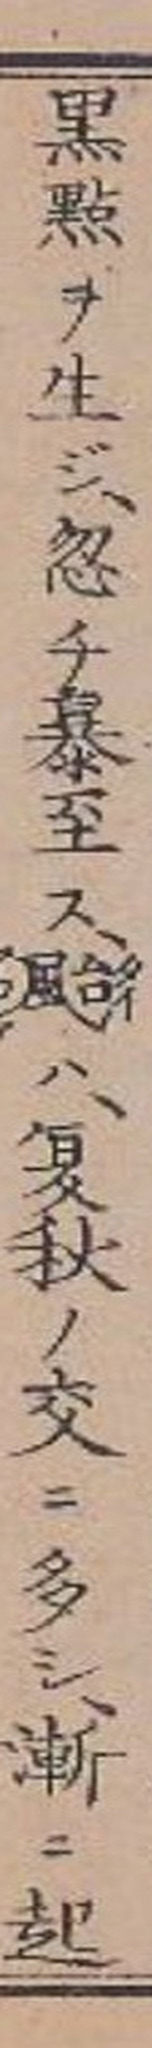黒点ヲ生ジ、忽チ暴至ス、颱ハ、夏秋ノ交ニ多シ、漸ニ起
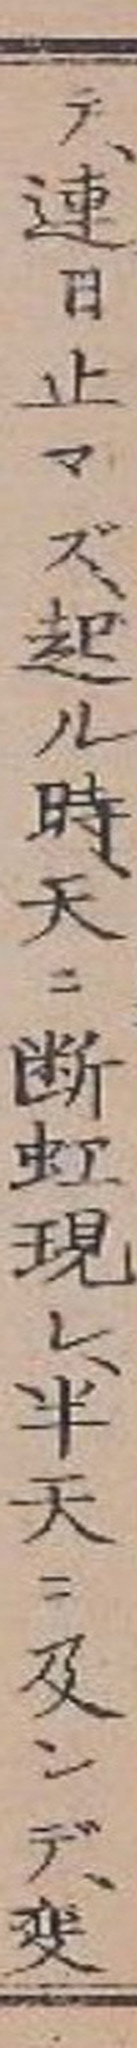テ、連日止マズ、起ル時、天ニ断虹現レ、半天ニ及ンデ、変
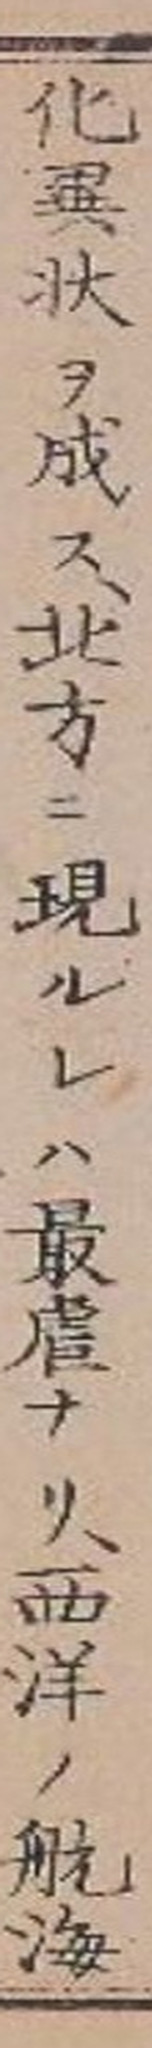化異状ヲ成ス、北方ニ現ルレハ最虐ナリ、西洋ノ航海
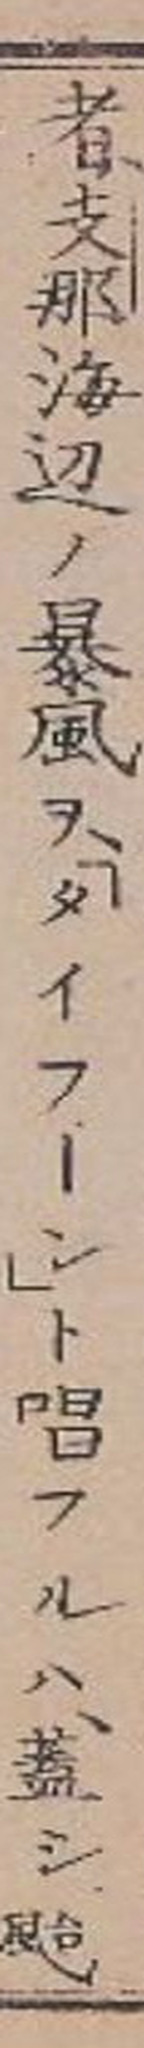者、支那海辺ノ暴風ヲ、「タイフーン」ト唱フルハ、蓋シ颱
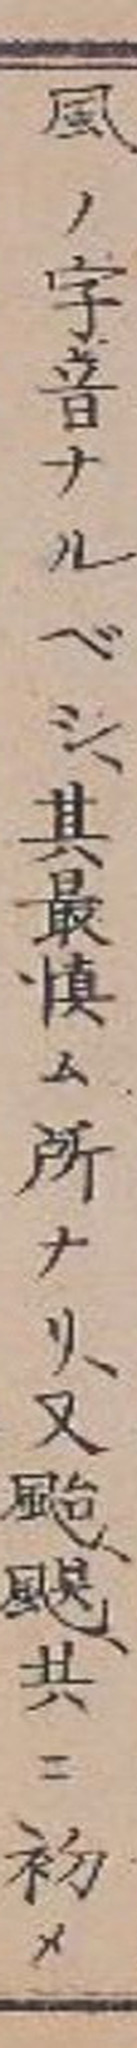風ノ字音ナルベシ、其最慎ム所ナリ、又颱、颶、共ニ初メ
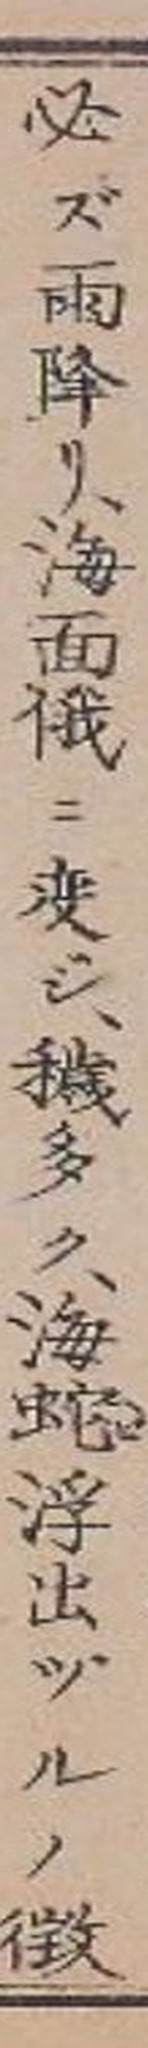必ズ雨降リ、海面俄ニ変ジ、穢多ク、海蛇浮出ヅルノ徴
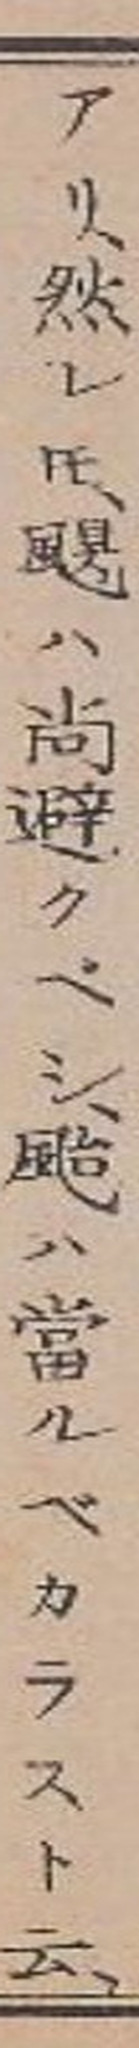アリ、然レトモ、颶ハ尚避クベシ、颱ハ当ルベカラスト云、
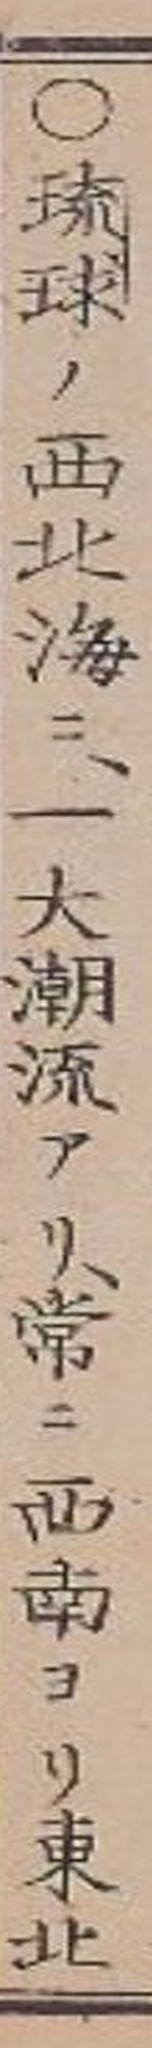○琉球ノ西北海ニ、一大潮流アリ、常ニ西南ヨリ東北
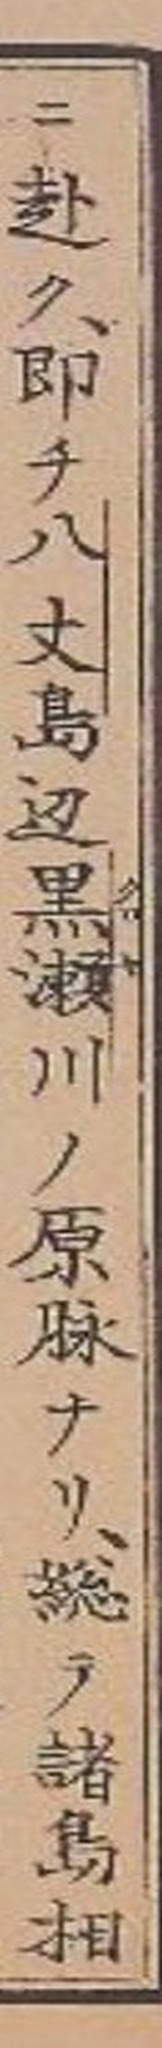ニ赴ク、即チ八丈島辺黒瀬川ノ原脈ナリ、総テ諸島相
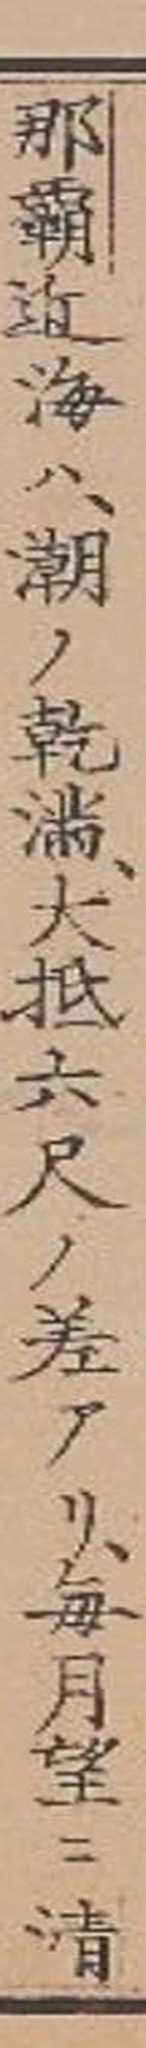那覇近海ハ、潮ノ乾満、大抵六尺ノ差アリ、毎月望ニ清
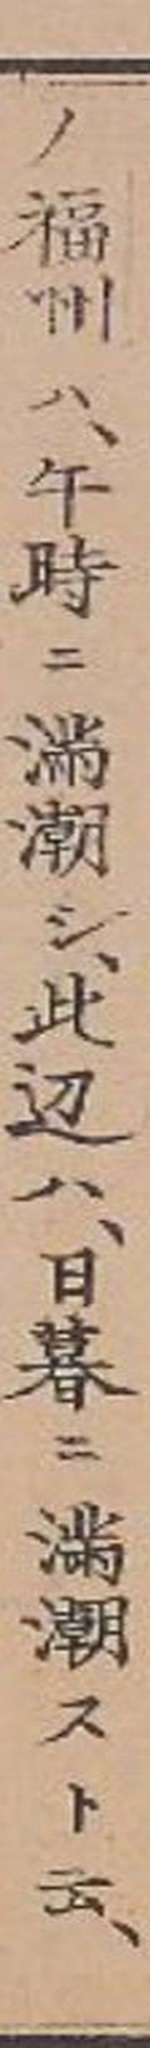ノ福州ハ、午時ニ満潮シ、此辺ハ、日暮ニ満潮スト云、
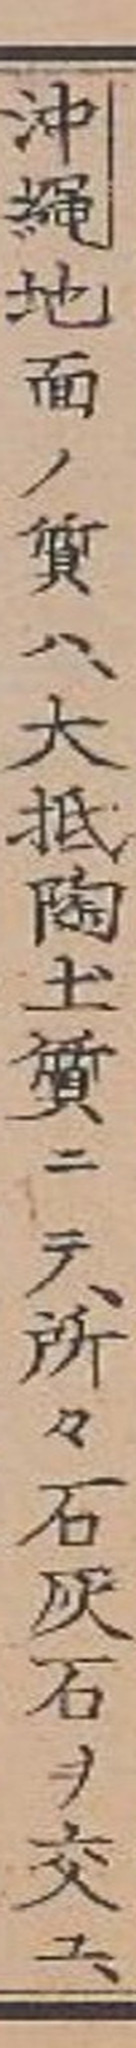沖縄地面ノ質ハ、大抵陶土質ニテ、所々石灰石ヲ交ユ、
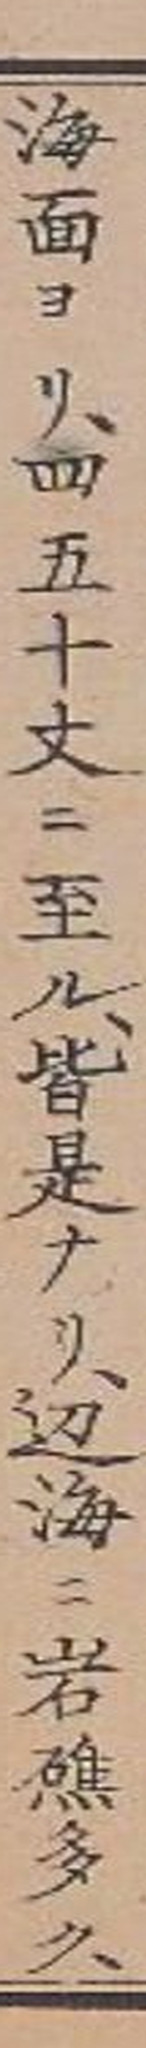海面ヨリ、四五十丈ニ至ル、皆是ナリ、辺海ニ岩礁多ク、
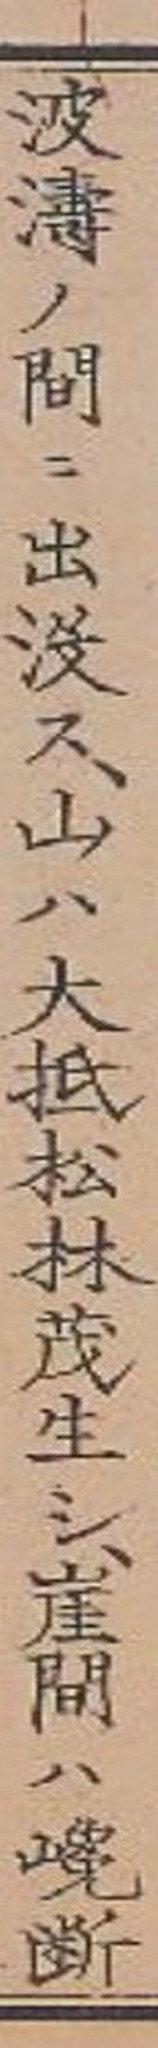波濤ノ間ニ出没ス、山ハ大抵松林茂生シ、崖間ハ巉断
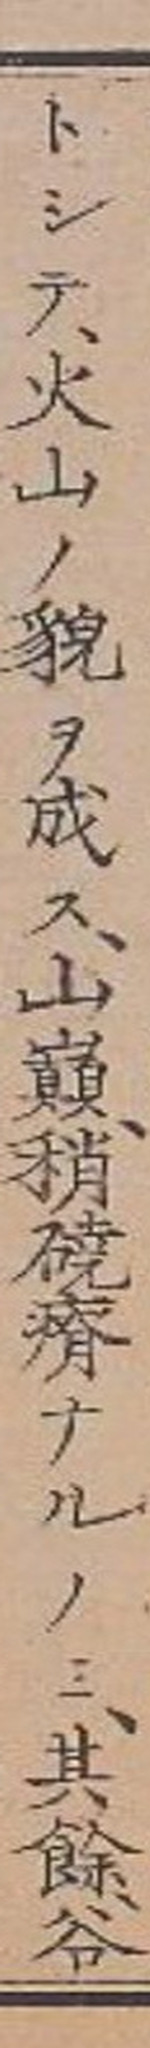トシテ、火山ノ貌ヲ成ス、山巓、稍磽瘠ナルノミ、其余、谷
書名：琉球新誌 巻上
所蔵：University of the Ryukyus Library
